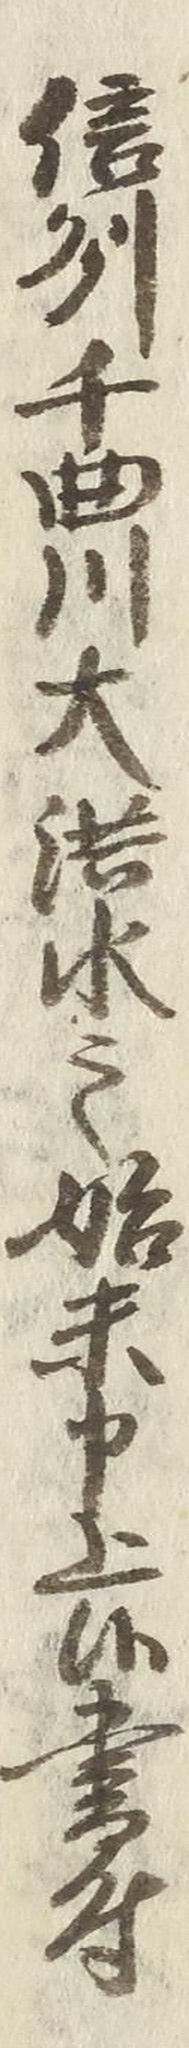信州千曲川大洪水之始末申上候書付
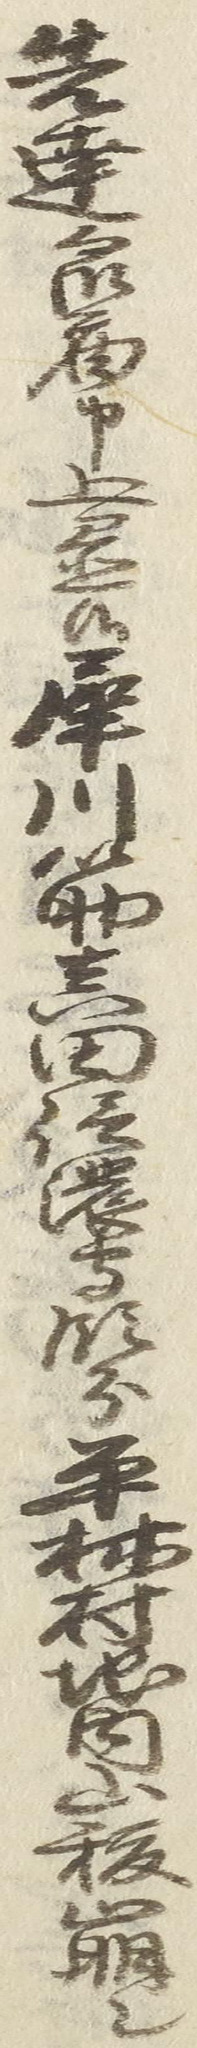先達而御届申上置候犀川筋真田信濃守領分平林村地内山抜崩し
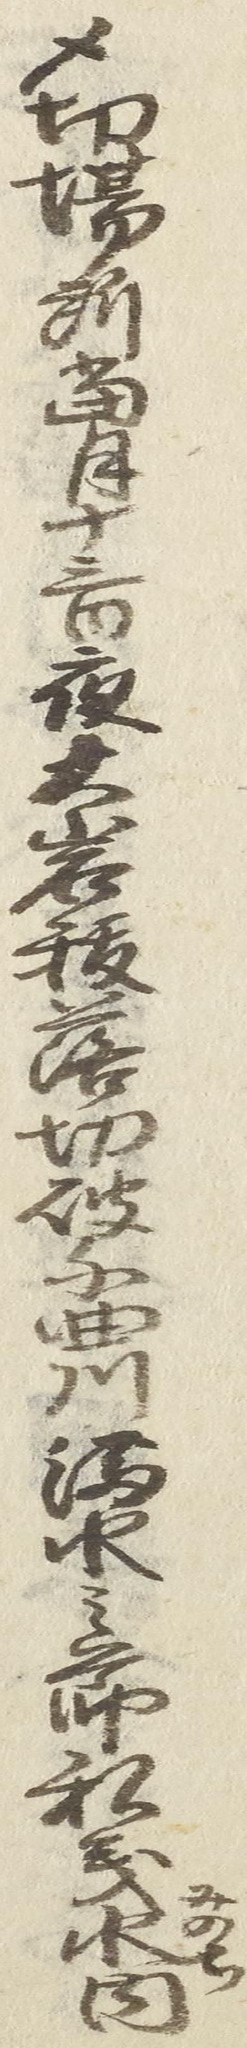〆切場所当月十三日夜大岩抜落切破千曲川満水之節私義水内
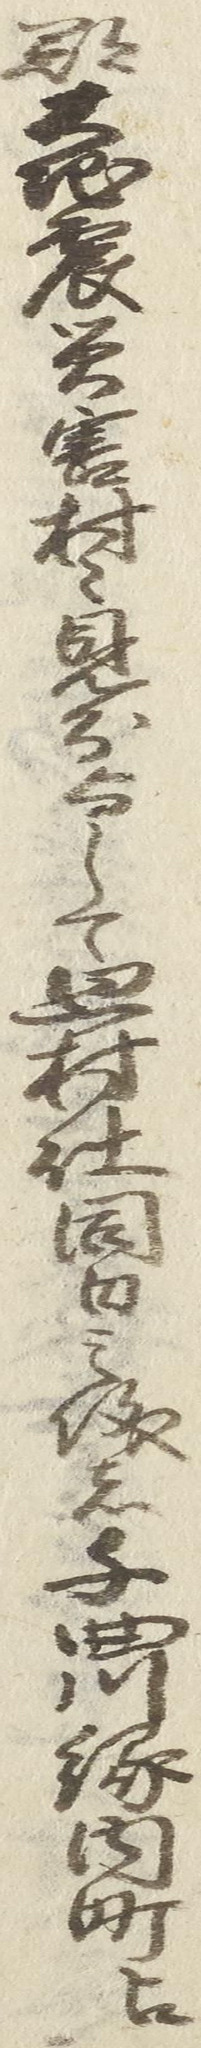郡大地震災害村々見分として廻村仕同日之儀は千曲川縁内江
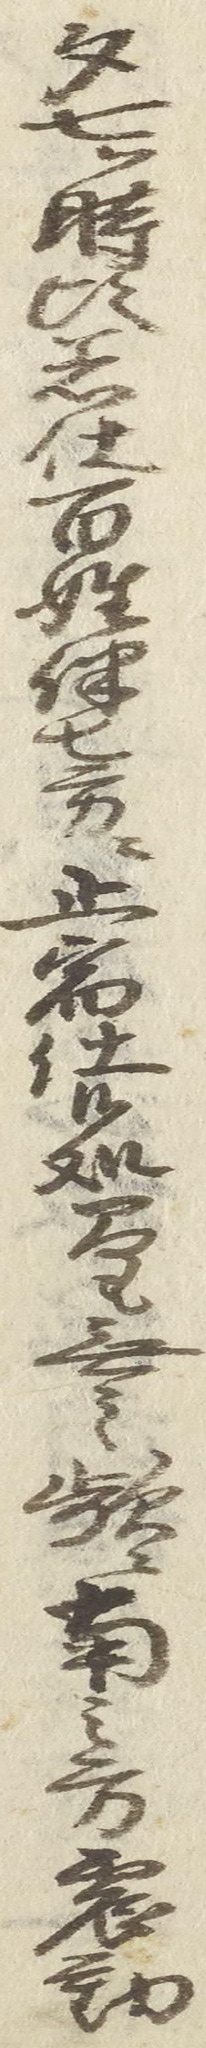夕七ッ時頃着仕百姓伴七方二止宿仕候処間も無く頻二南之方震動

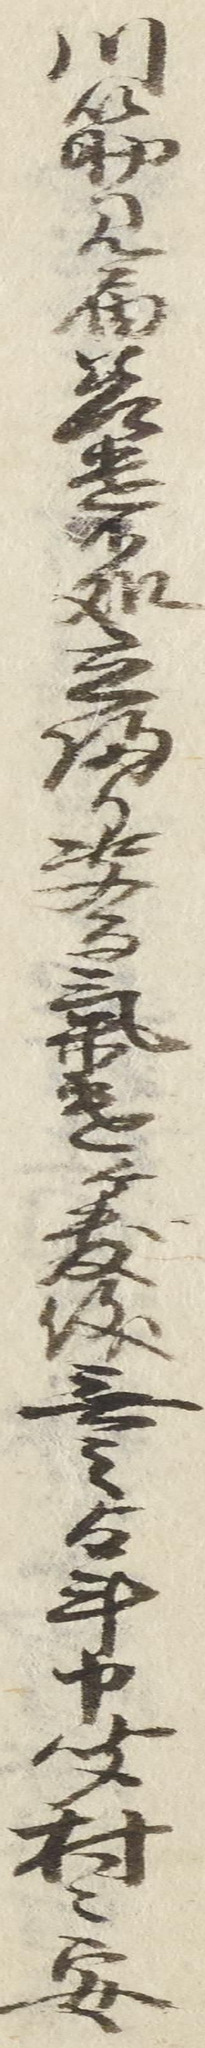川筋見届差遣候処立帰決而気遣け敷無之旨斗申聞村々安
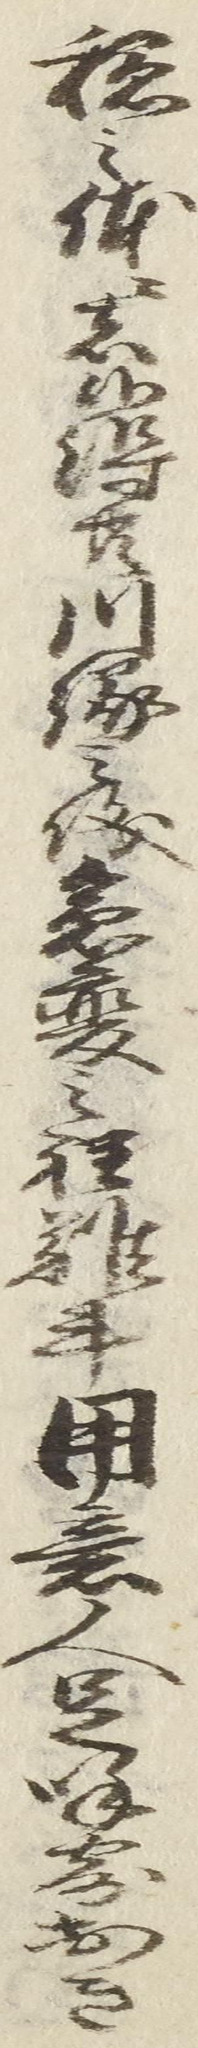穏之儀二は候得共川縁之儀急変之程難と用意人足呼寄おき
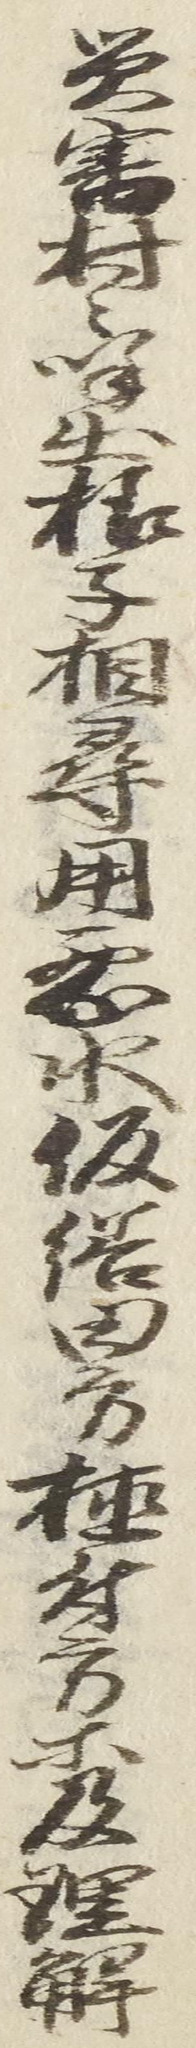災害村々呼出様子相尋用悪水仮繕田方植付方等及利解
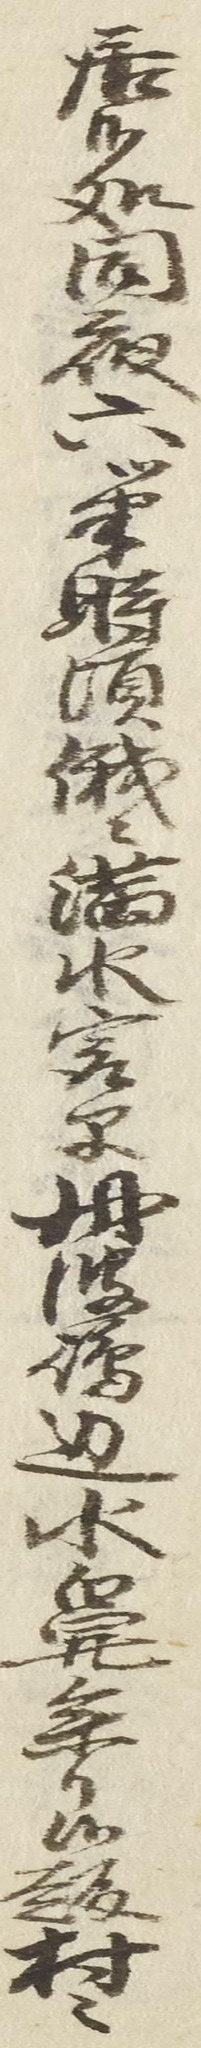居候処同夜六半時頃俄二満水最早丹波島辺水鼻参り候趣村々
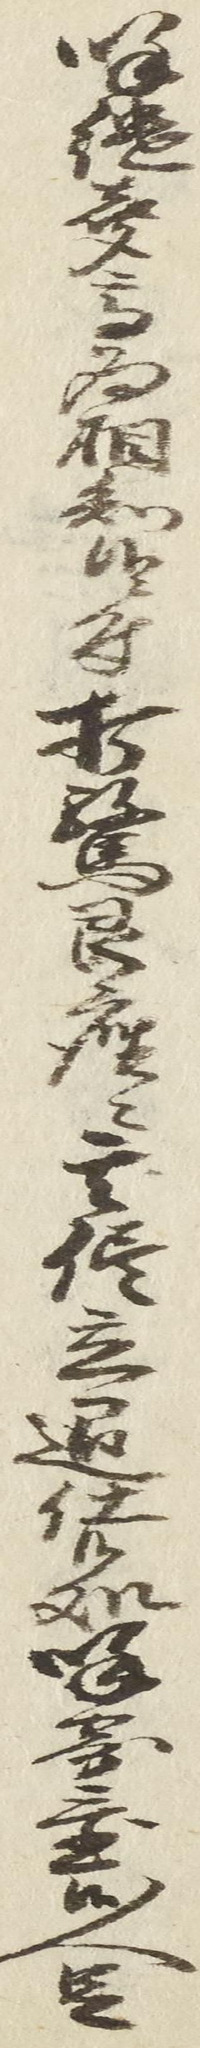呼継声高為相知候二付打驚即座二其儘立退仕候処呼寄置候人足
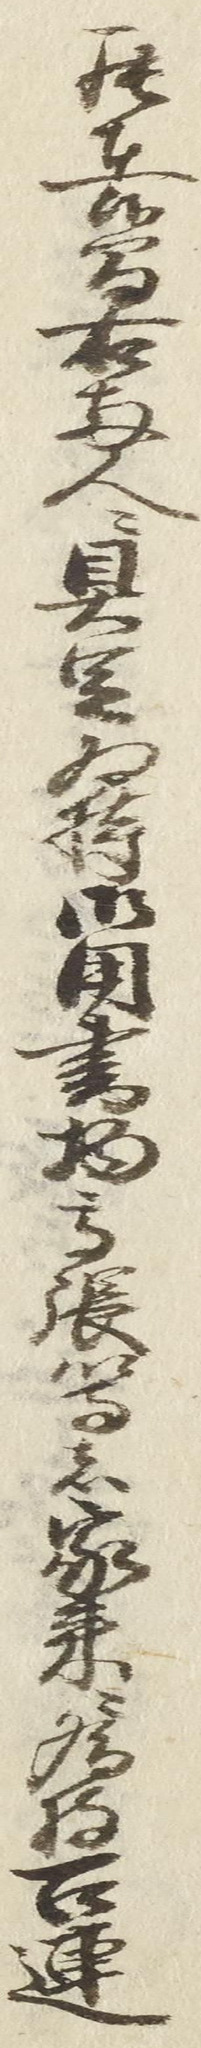罷在候間右両人二具足為持御用書物高張等は家来二為持召連
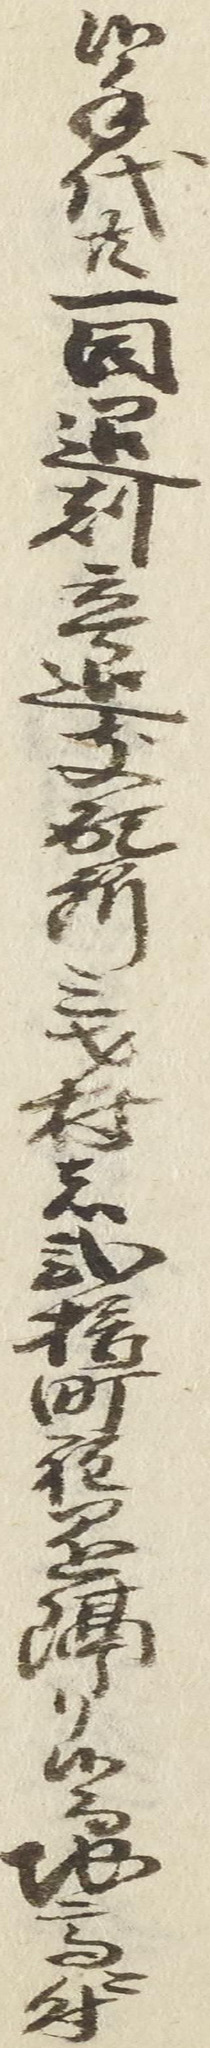候手代共一同速刻立退支配所三才村ハは弐拾町程懸隔候而地高二付
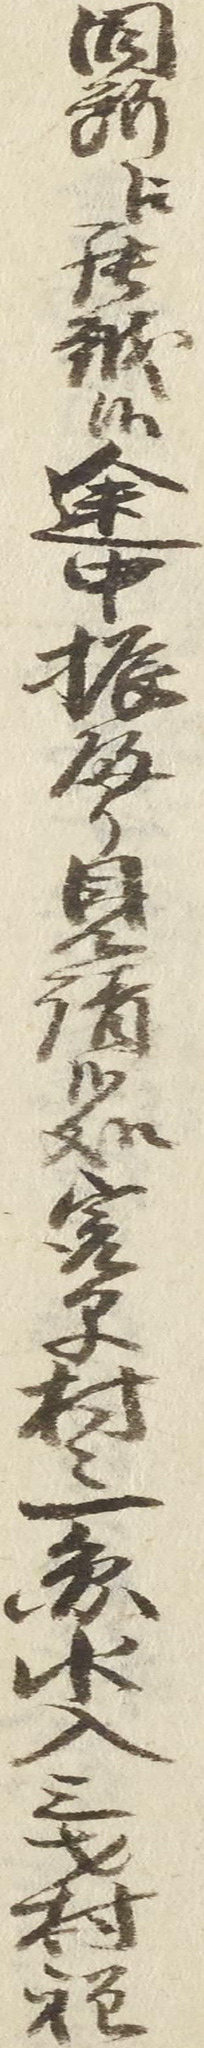同所江罷越候途中振帰り見請候処最早村々一円水入三才村程
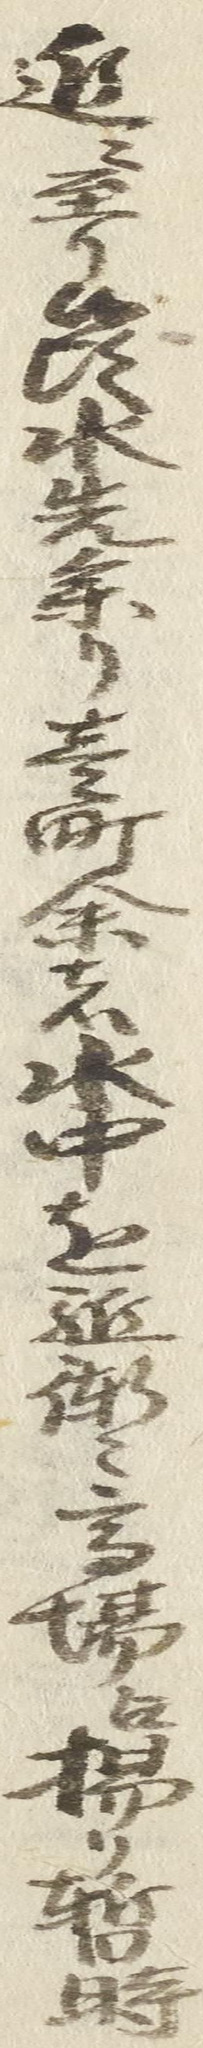近二至候頃水先参り壱町余は水中を駆漸々高場へ揚り暫時
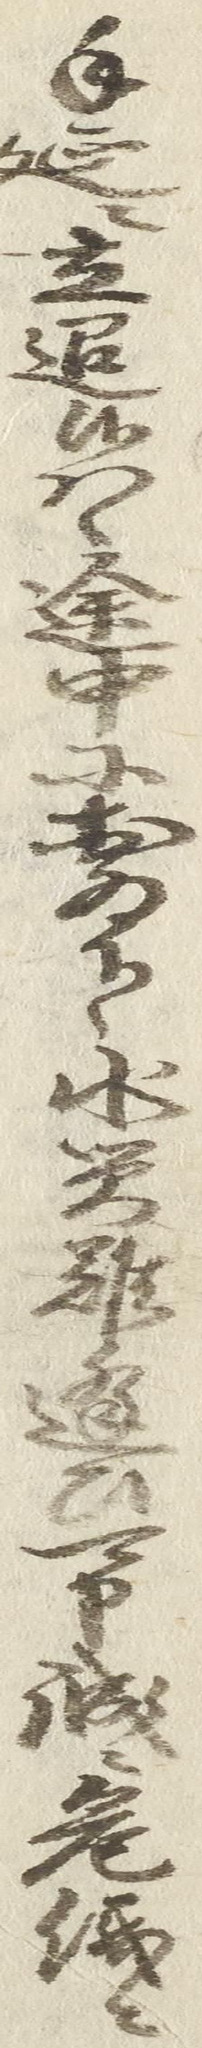手延二退通候ハゝ途中におゐて水災難逢ひ可申誠に危儀二
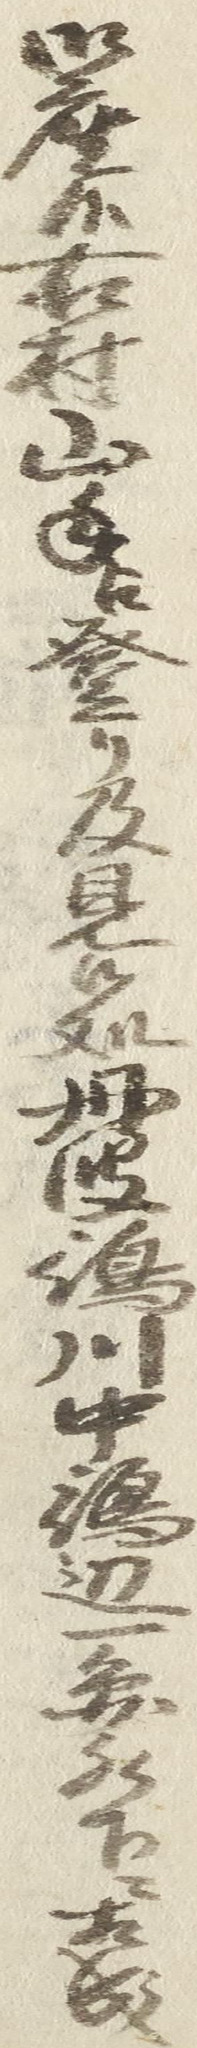御座候右村山手江登り及見候処丹波島川中嶋辺一円水下二相成
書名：従往古地震御届書記誌之一
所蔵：東京大学地震研究所図書室 Earthquake Research Institute Library, The University of Tokyo, JAPAN
